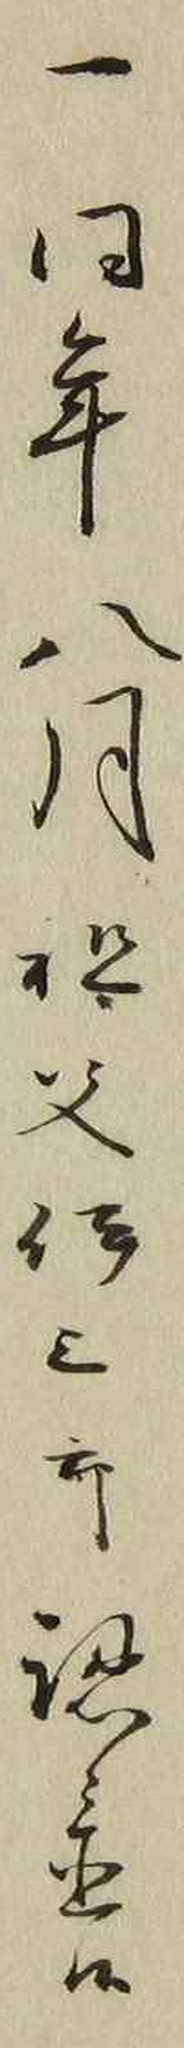一同年八月祖父伊三郎認置候
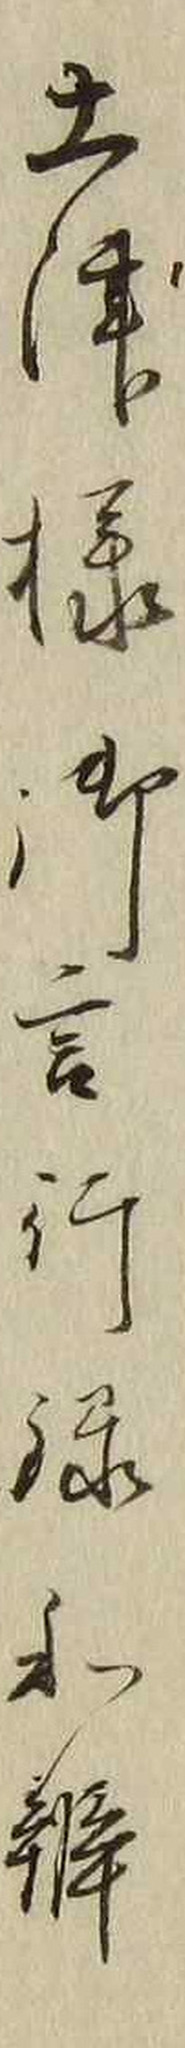土津様御言行録和辯
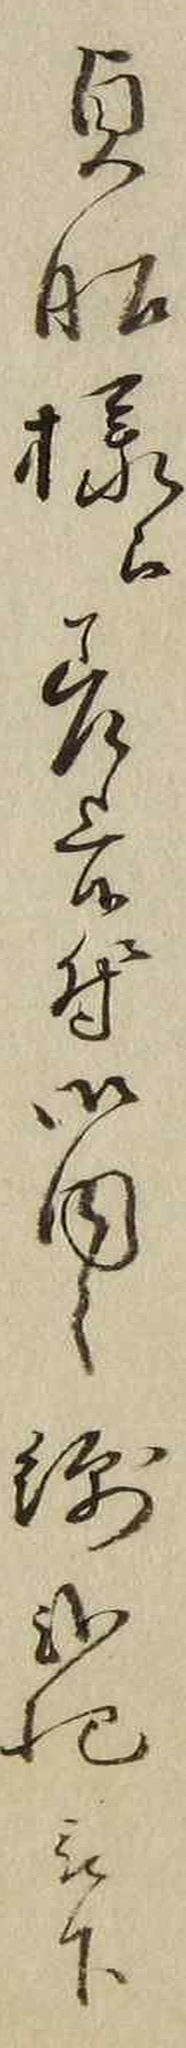貞照様江差上候に付御内々綿二把被下
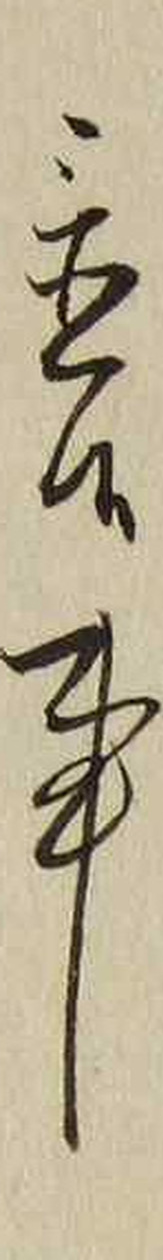置候事
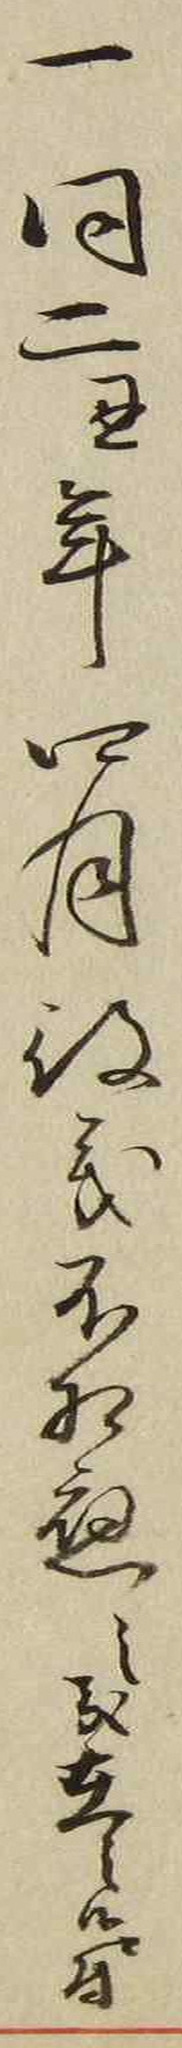一同二丑年四月役義不相応の義在之候に付

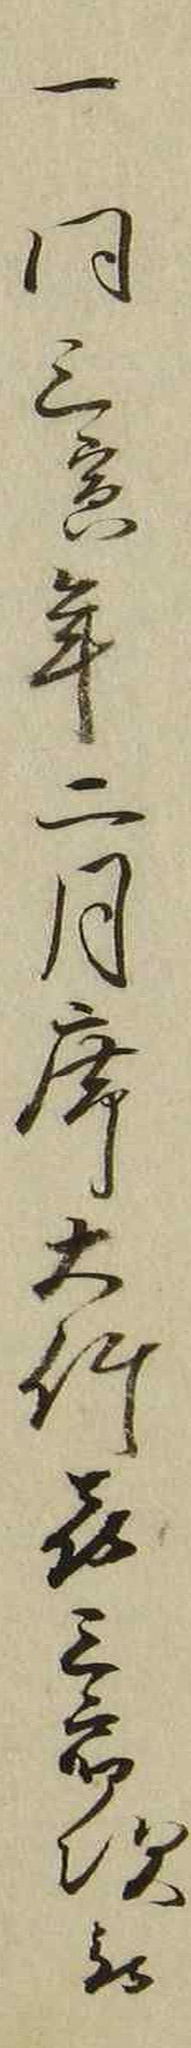一同三寅年二月席大竹喜三郎次被
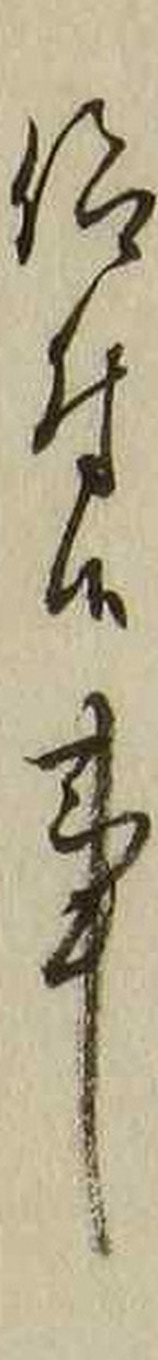仰付候事
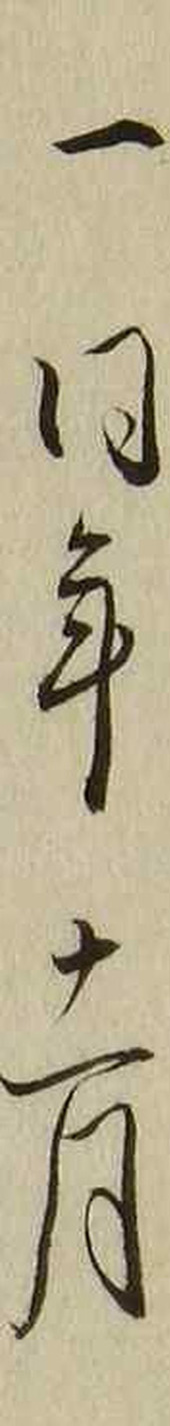一同年十一月
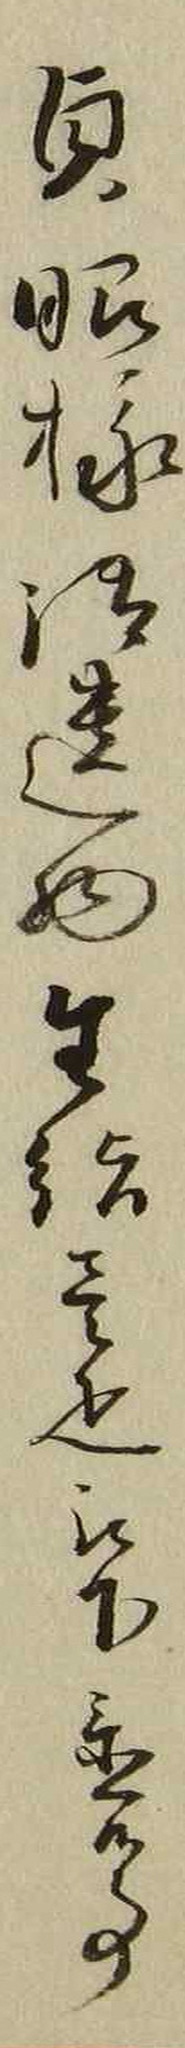貞昭様御遺物生綿壱疋被下置候事
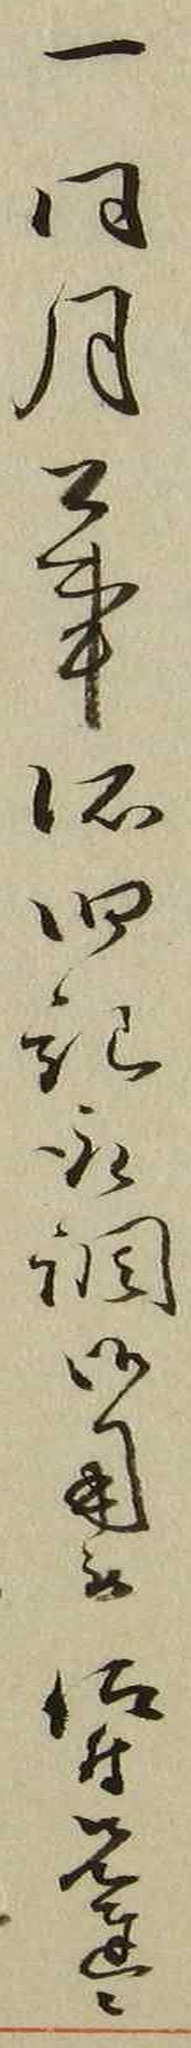一同月公事所旧記取調御用被仰付先達て
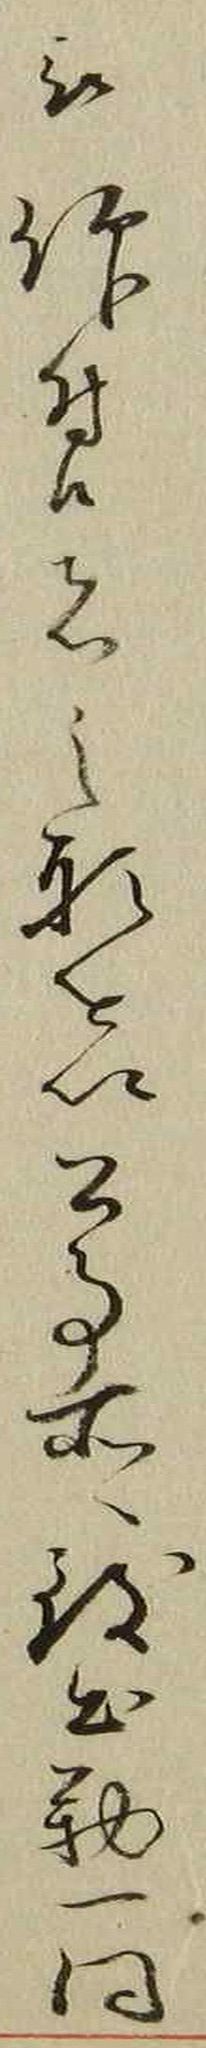被仰付候者之形を以公事所へ致出勤一同
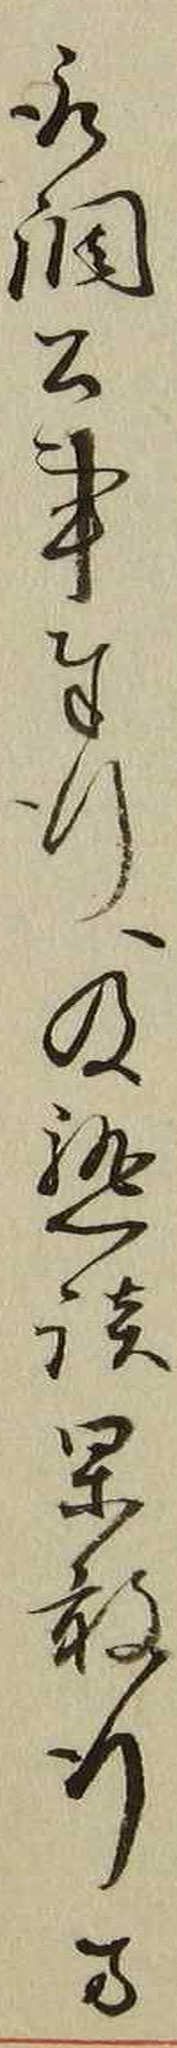取調公事奉行へ及熟談果敢行方
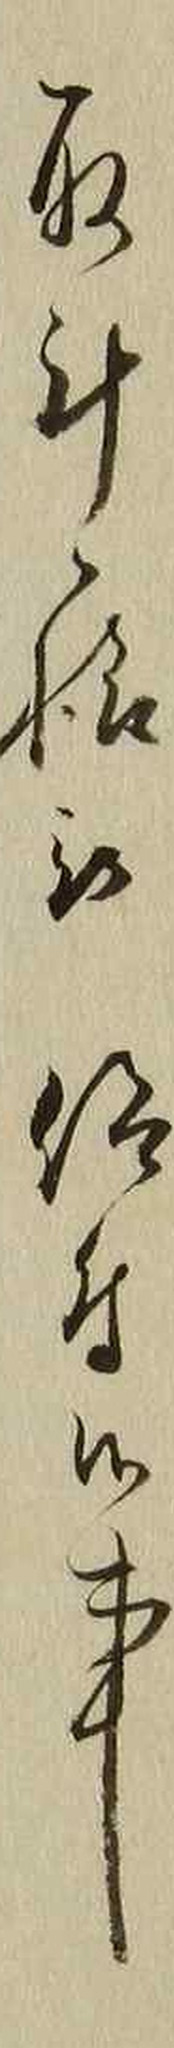取計候様被仰付候事
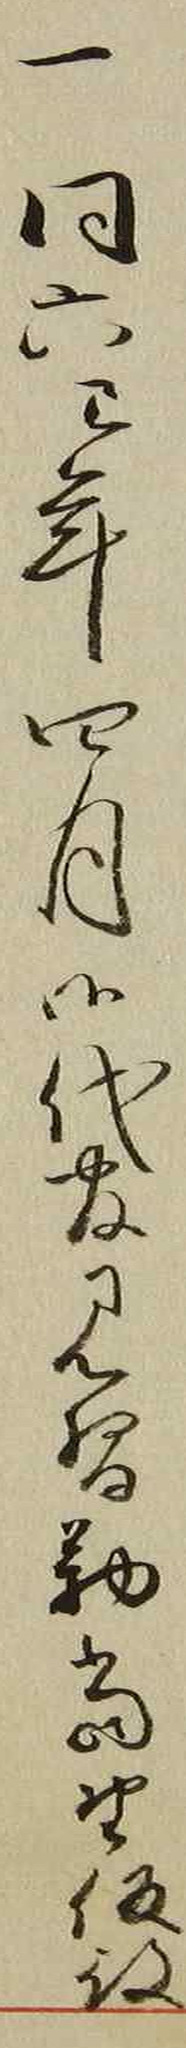一同六巳年四月御代官見習勤当座仮役
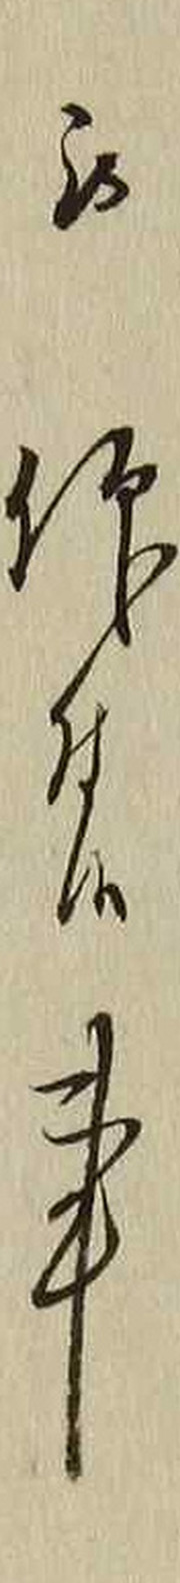被仰付候事
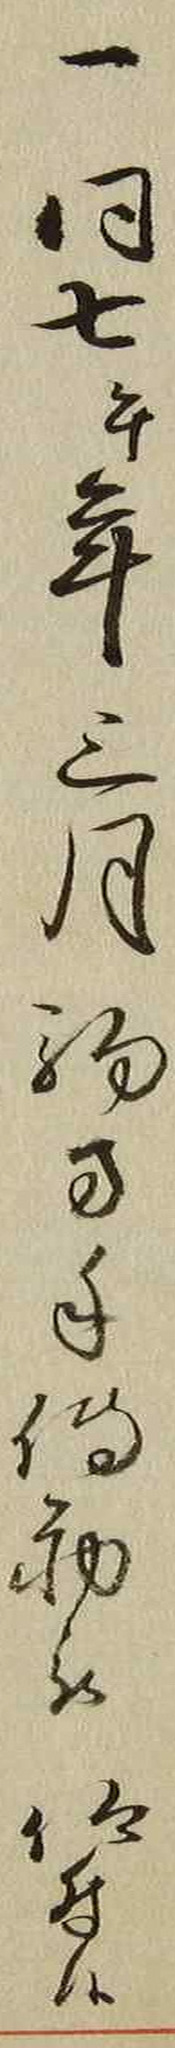一同七午年三月駒方手伝勤被仰付候
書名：諸士系譜　巻之3　い之部3
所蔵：会津若松市立会津図書館
